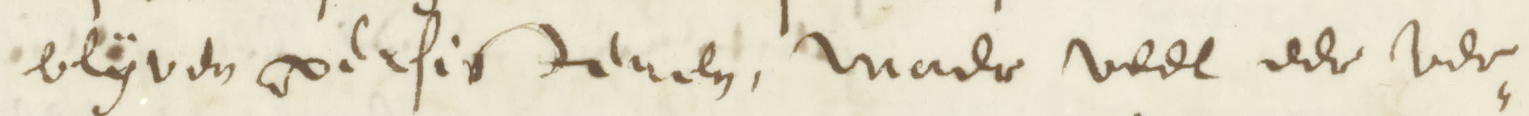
blijven persisteren, maer veel eer ver„
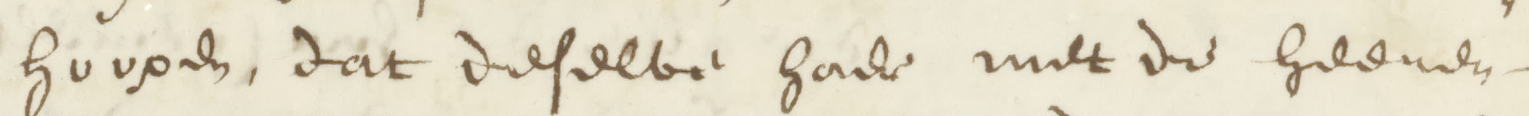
hoopen, dat deselve haer met de heeren
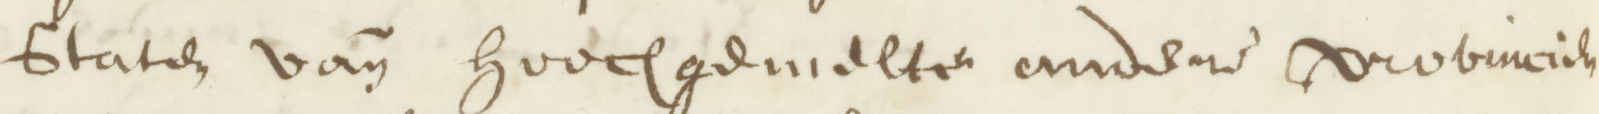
Staten van hoochgemelte andere provincien
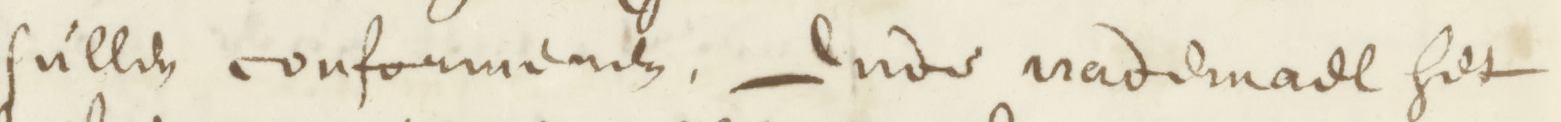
sullen conformeren. Ende nademael het
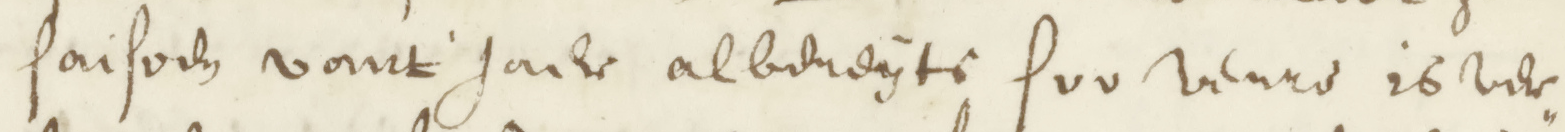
saisoen vant‛ jaer albereijts soo verre is ver„
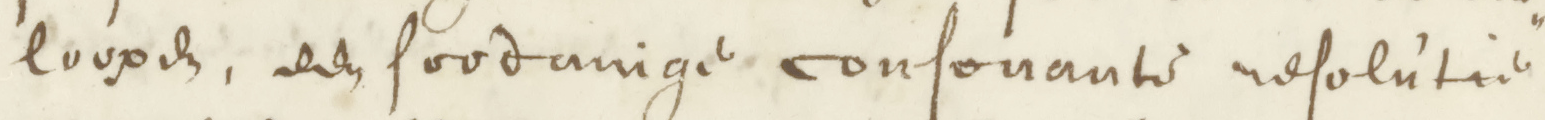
loopen, een soodanige consonante resolutie
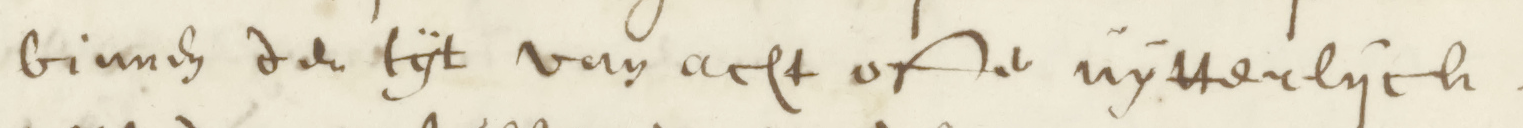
binnen den tijt van acht ofte uijtterlijck
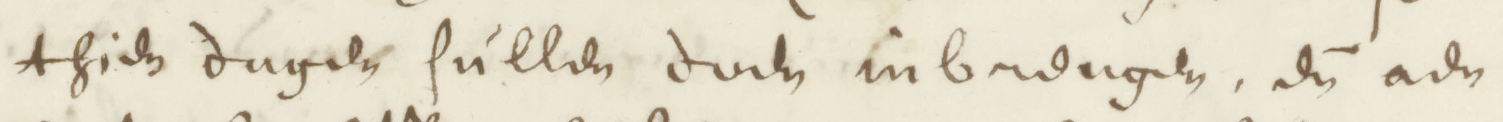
thien dagen sullen doen inbrengen, en aen
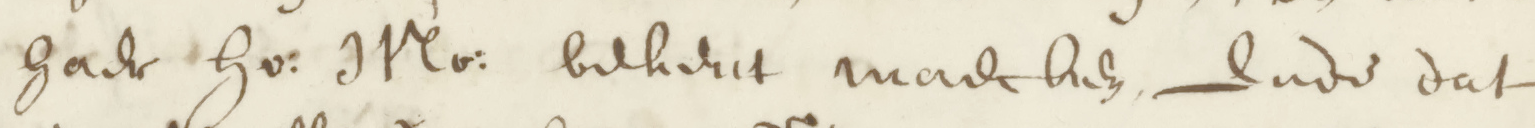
haer ho:Mo: bekent maecken, ende dat
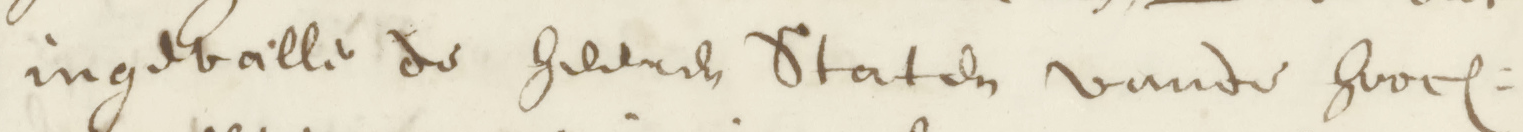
ingevalle de heeren Staten vande hooch„
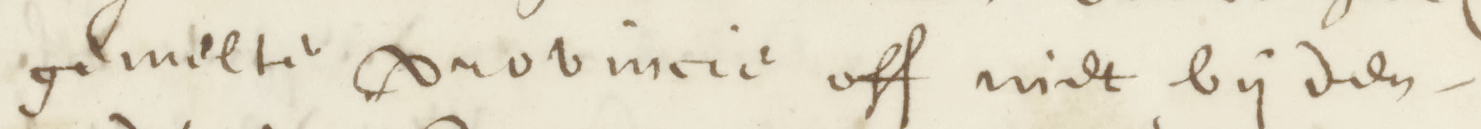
gemelte provincie off niet bij den
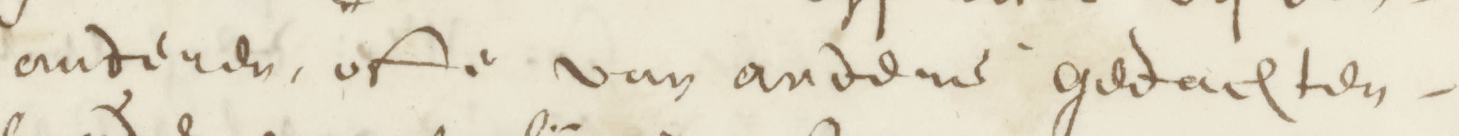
anderen, ofte van andere gedachten
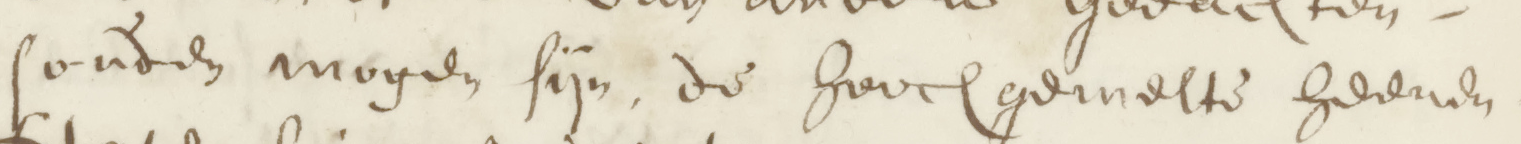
souden mogen sijn, de hoochgemelte heeren
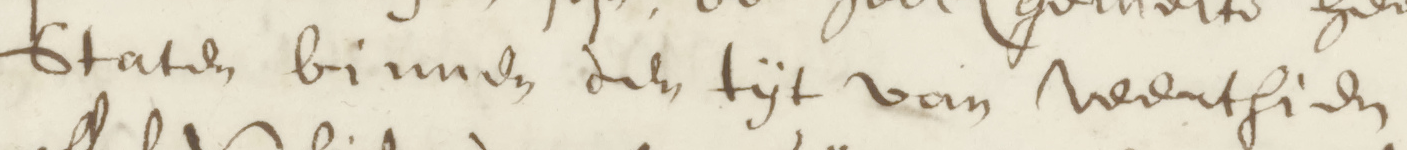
Staten binnen den tijt van veerthien
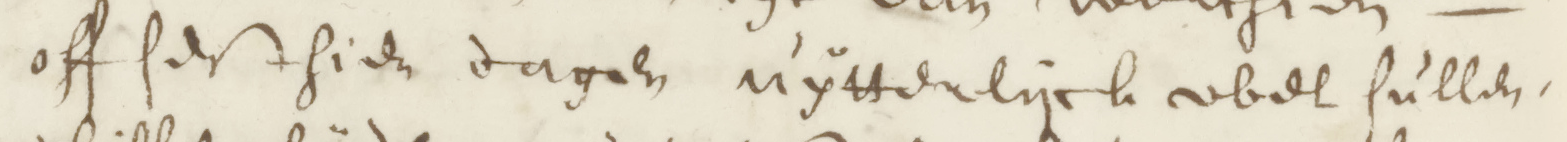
off sesthien dagen uijtterlijck wel sullen
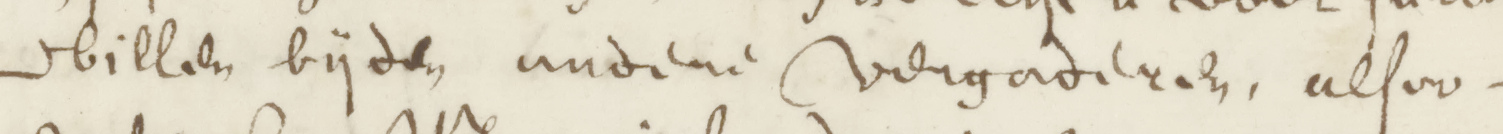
willen bijden andere vergaderen, alsoo
